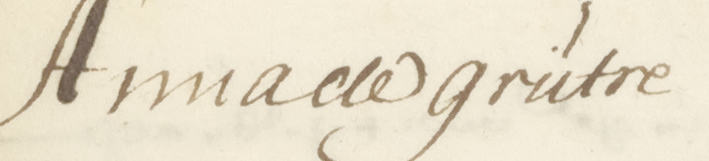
Anna de grutre
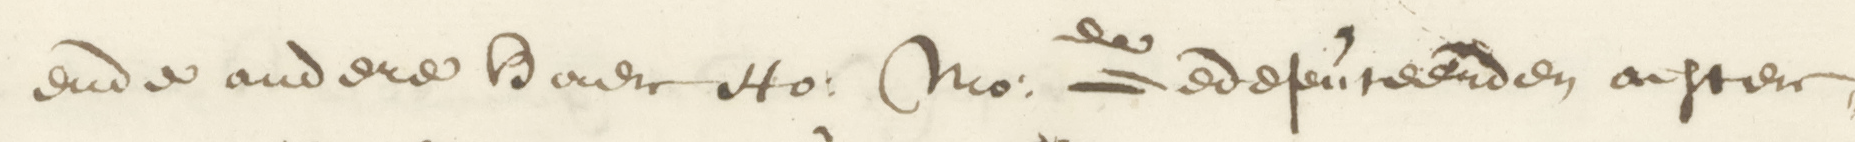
ende andere haer Ho:Mo: Gedeputeerden achter„
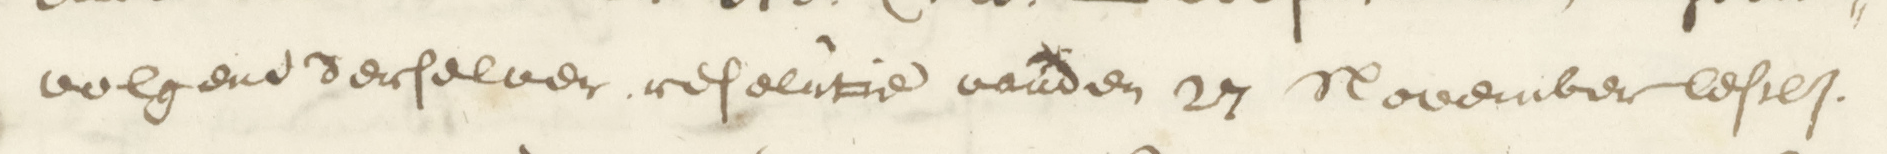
volgens derselver resolutie vanden 27 November lestl.
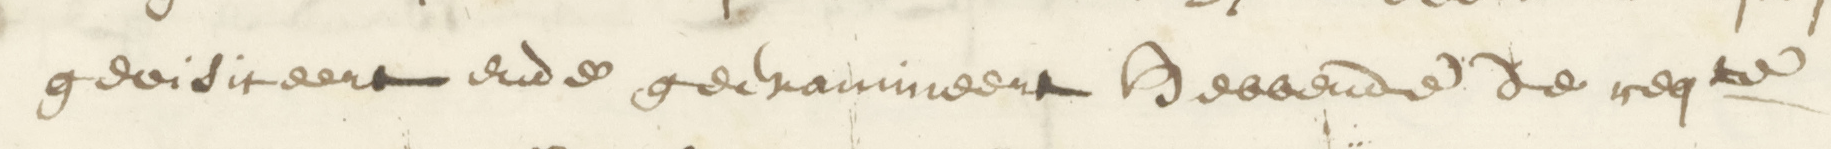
gevisiteert ende geexamineert hebbende de reqte
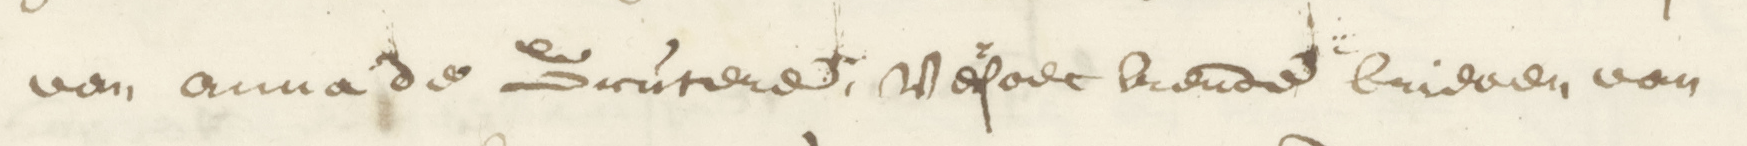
van anna de Grutere, versoeckende brieuen van
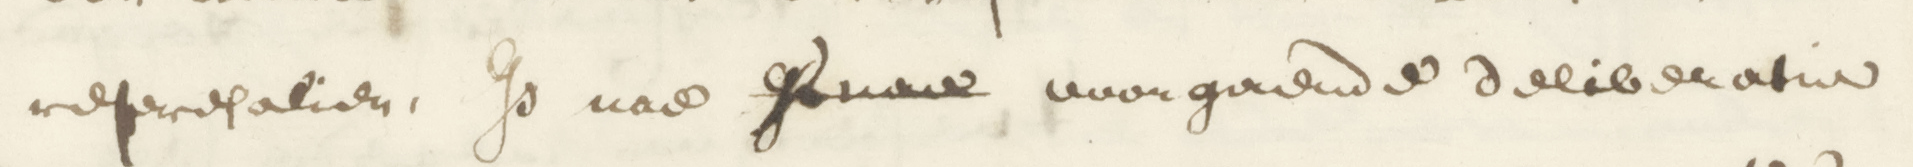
represalien. Is nae Is nae voorgaende deliberatie
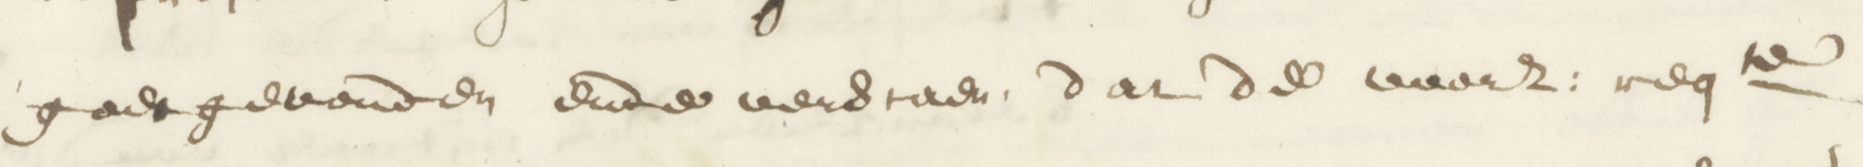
goetgevonden ende verstaen, dat de voorz: reqte
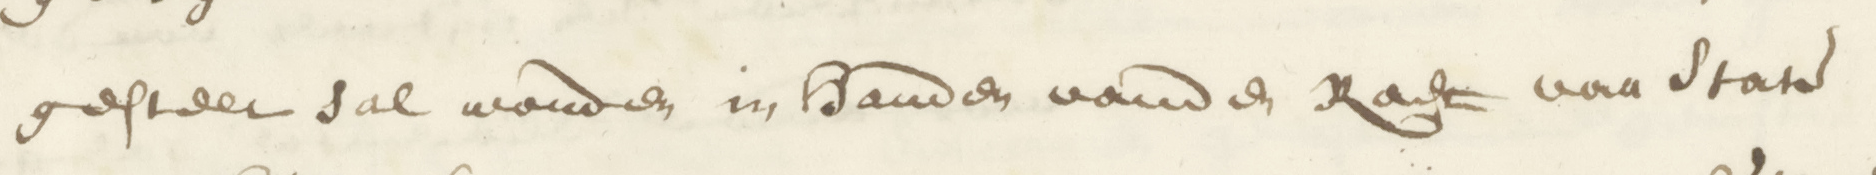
gestelt sal worden in handen vanden Raet van State
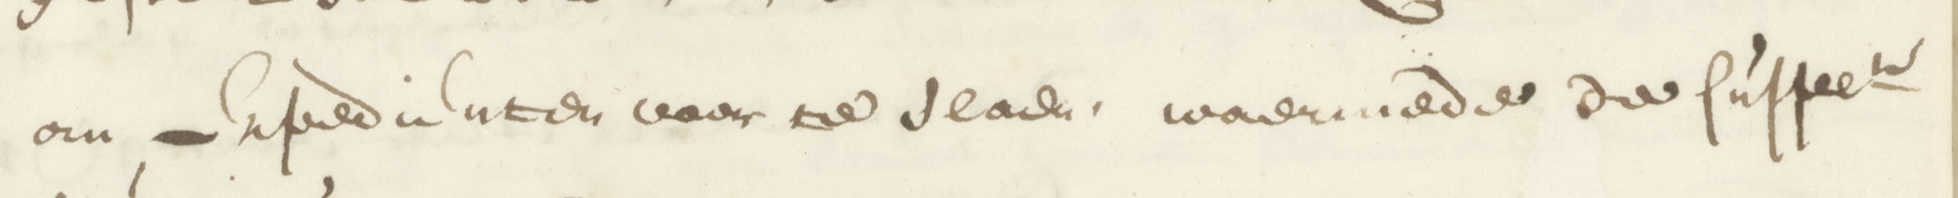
om Expedienten voor te slaen, waermede de supplte
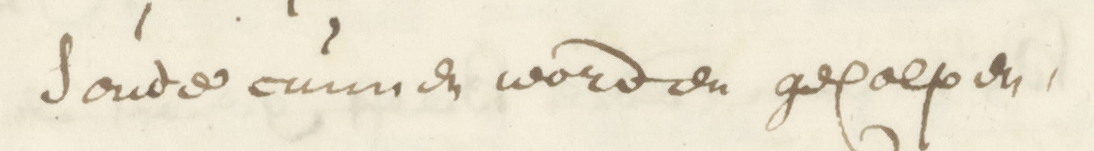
soude cunnen worden geholpen.
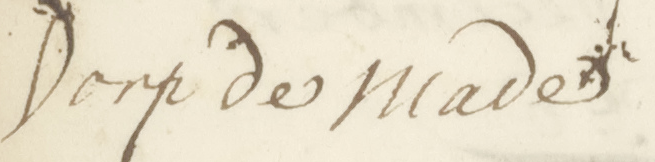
Dorp de Made
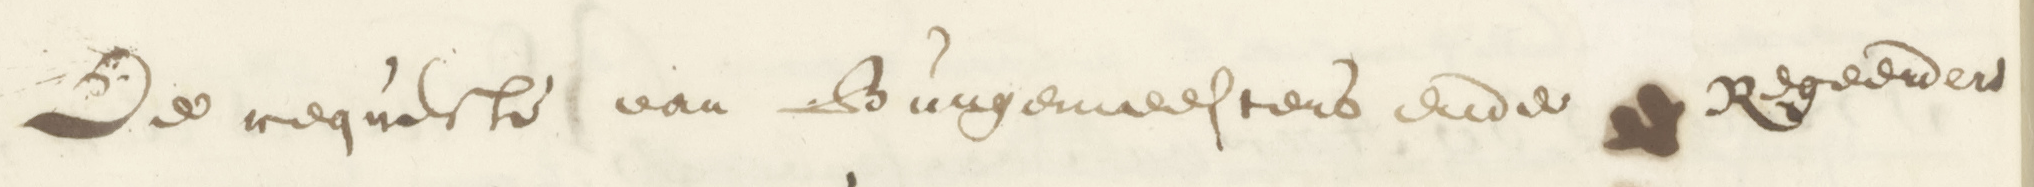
De requeste van Burgemeesters ende Regeerders
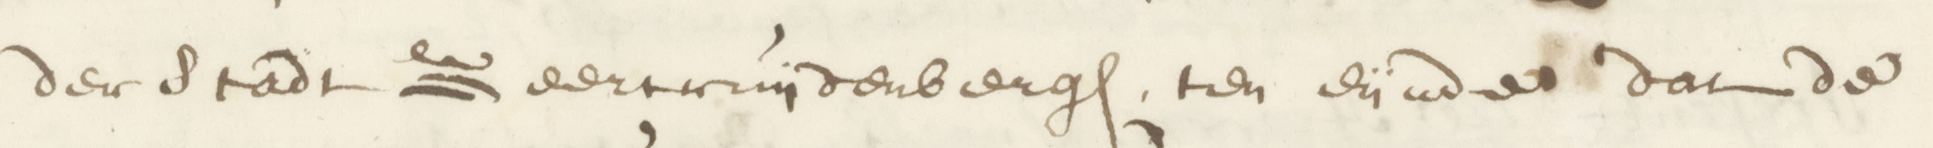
der Stadt Geertruijdenbergh, ten eijnde dat de
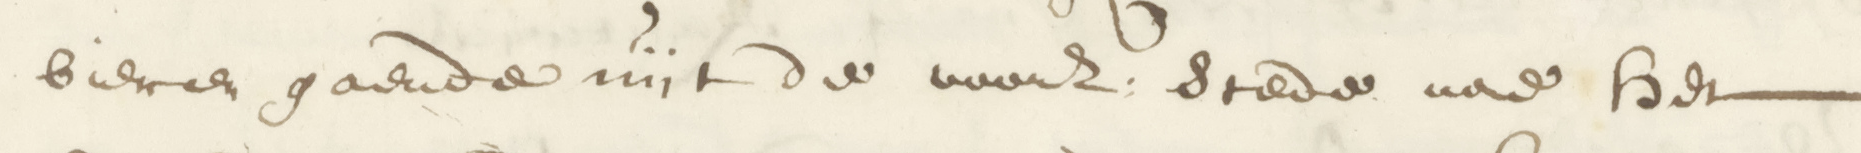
bieren gaende uijt de voorz: Stede nae het
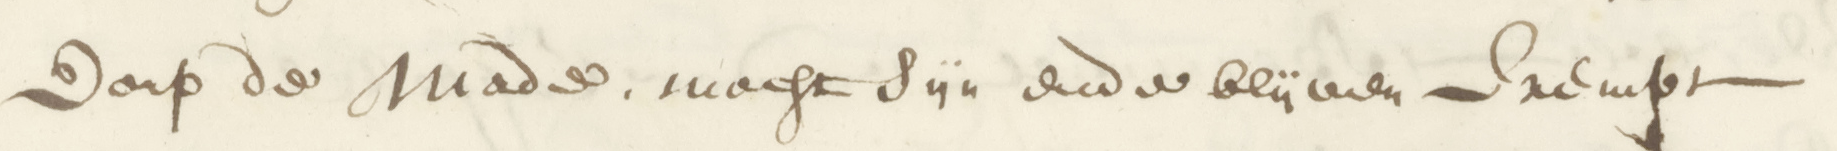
Dorp de Made, mocht sijn ende blijven Exempt
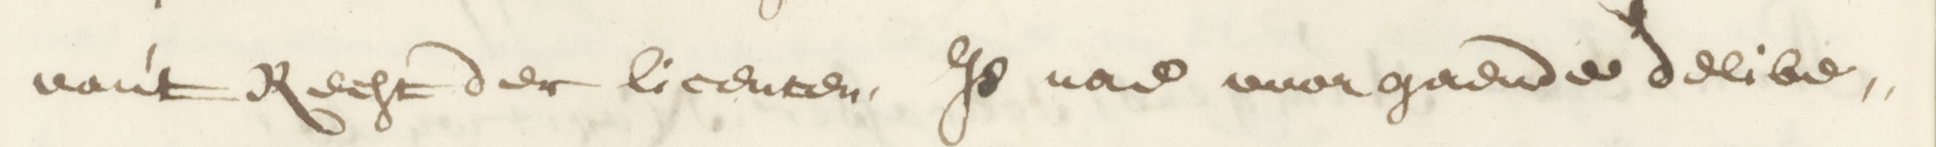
van't Recht der licenten. Is nae voorgaende delibe„
